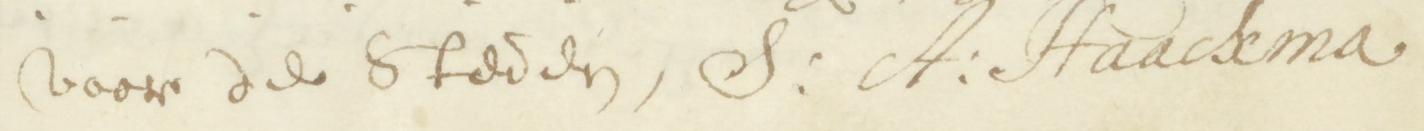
voor de steden, S: A: Haackma,
